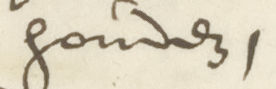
houden.
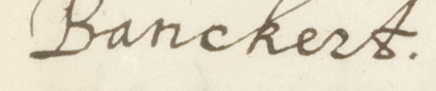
Banckert.
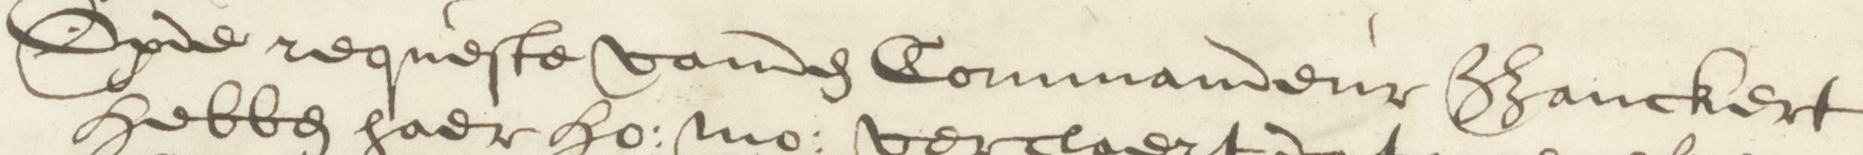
Opde requeste vanden Commandeur Banckert
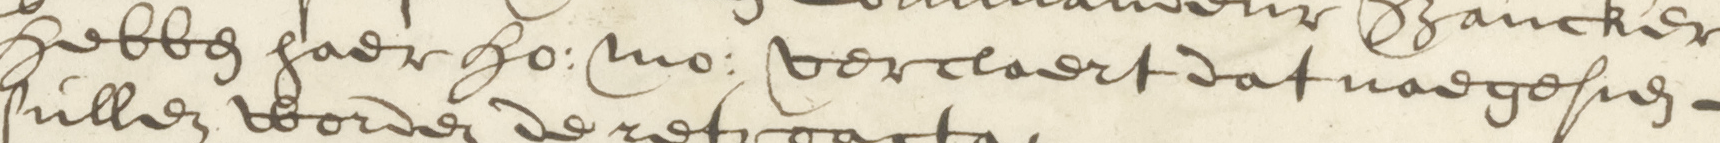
hebben haer Ho:Mo: verclaert dat naegesien
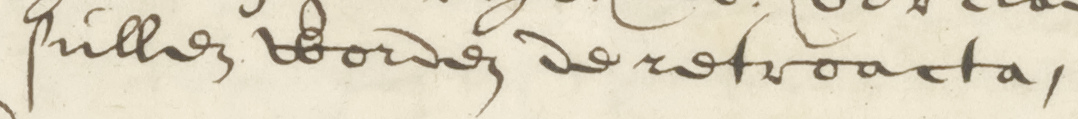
sullen worden de retroacta.
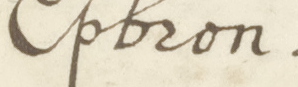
Epbron
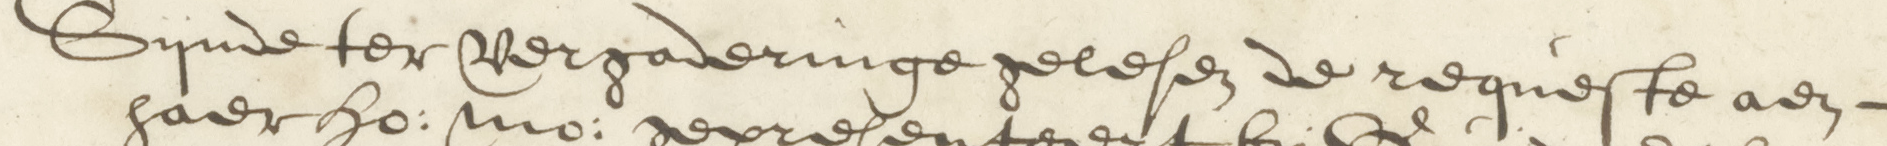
Sijnde ter Vergaderinge gelesen de requeste aen
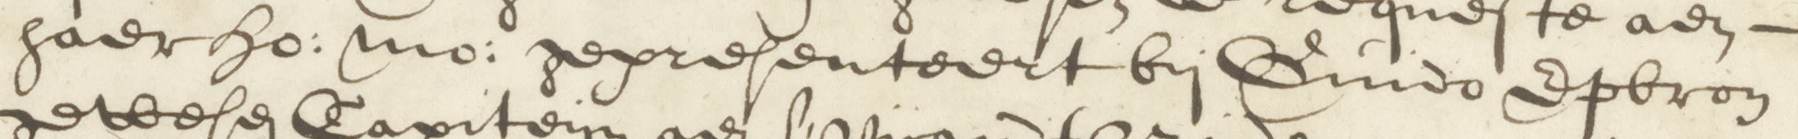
haer Ho:Mo: gepresenteert bij Guido Epbron
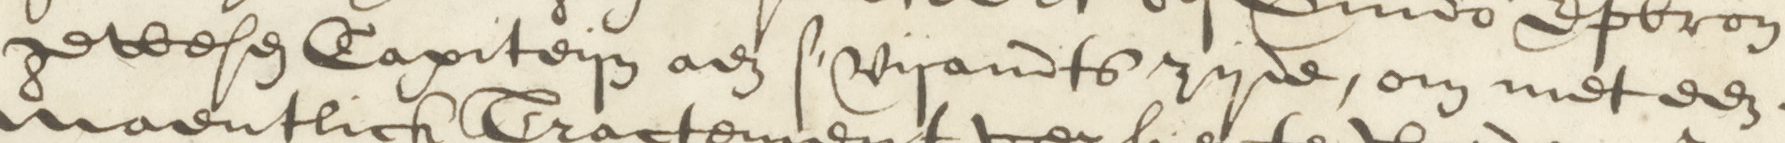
gewesen Capiteijn aen s‛Vijandts zijde, om met een
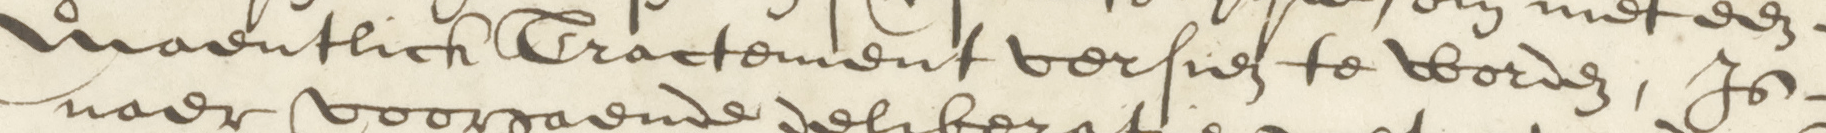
Maentlick Tractement versien te worden. Is
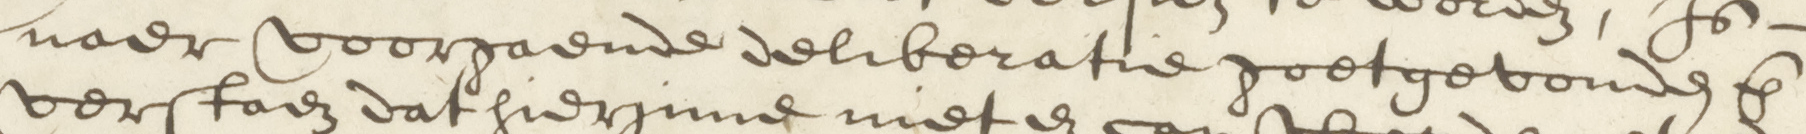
naer voorgaende deliberatie goetgevonden &
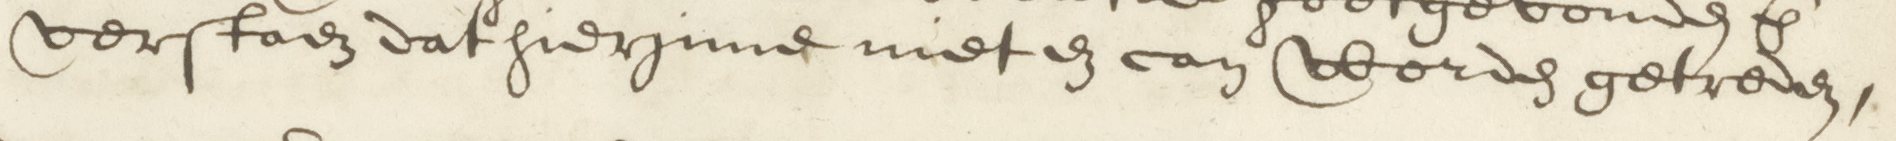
verstaen dat hierinne niet en can worden getreden.
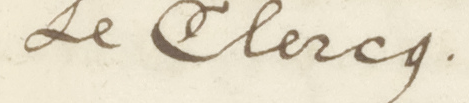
Le Clercq.
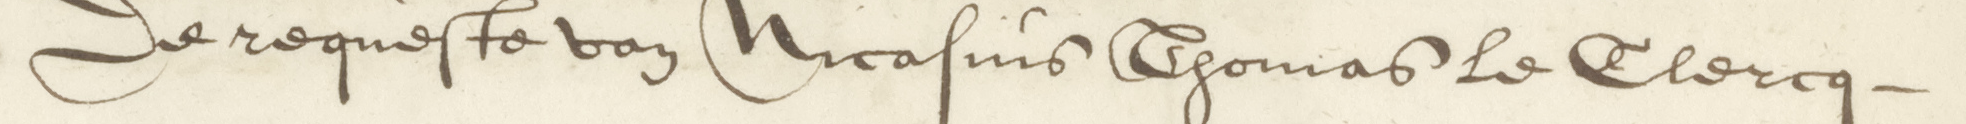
De requeste van Nicasius Thomas le Clercq -
